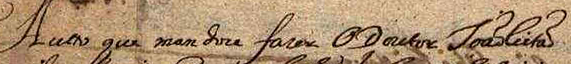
Autto que mandou fazer O Doutor Ioão leitaõ
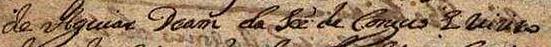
de Aguiar Deam da Seé de Conguo E vizita
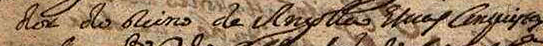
dor do Reino de Angolla E suas Conquistas
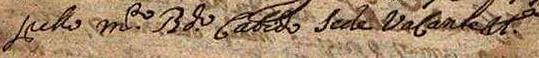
pello m.to R.do Cabido Sede Vacante tt.a
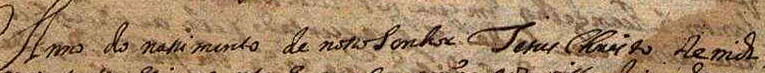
Anno do nascimento de nosso Senhor Iesus Christo de mil
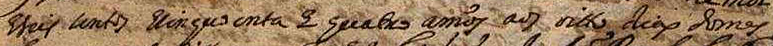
E seiscentos E cinquoenta E quatro annos aos oitto dias do mes
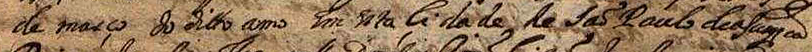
de março do ditto anno Em Esta Cidade de Saõ Paulo de Asunpçā
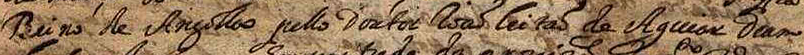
Reino de Angolla pello Doutor Ioaõ leitaõ de Aguiar Deam
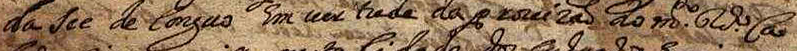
da See de Conguo Em uertude da prouizaõ do m.to Rd.o Ca
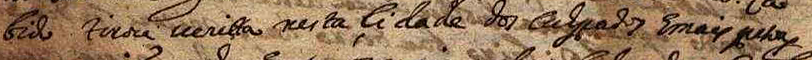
bido tirou uezitta nesta Cidade dos culpados E mais pesoas
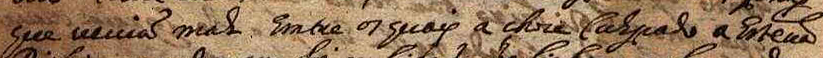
que uiuiaõ mal Emtre os quaes achou Culpado a Esteuā
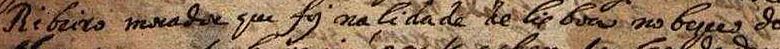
Ribeiro morador que foj na Cidade de lisboa no bequo do
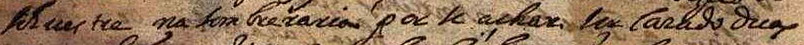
Siluestre na sombreraria por se achar ser Cazado duas
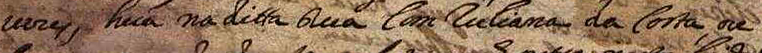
uezes, huā na ditta Rua Com Iuliana da Costa, ou
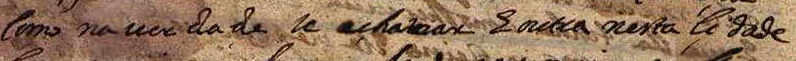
Como na uerdade se chamar, E outra nesta Cidade
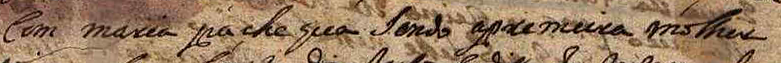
Com maria pachequa Sendo a premeira molher
